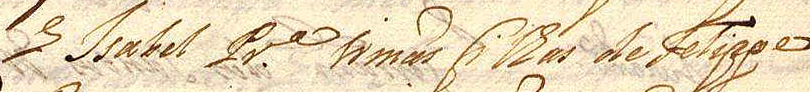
E Isabel Pr.a Irma̅s filhas de Felippe
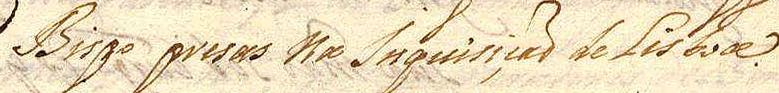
Bispo presas na Inquisição de Lisboa.
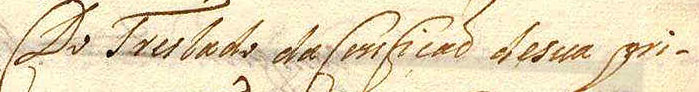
Do Treslado da Confição de sua pri
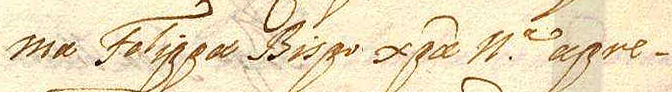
ma Felippa Bispo xpa̅ n.a apre
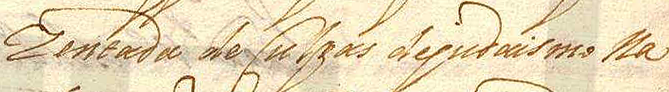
Zentada de Culpas de judaismo na
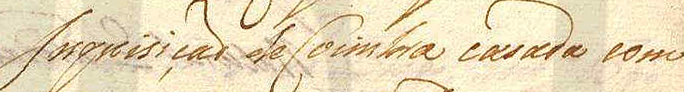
Jnquisição de Coimbra casada com
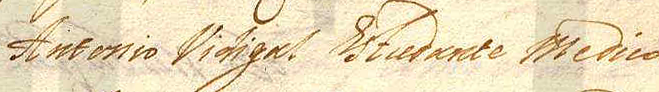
Antonio Vidigal Estudante medico
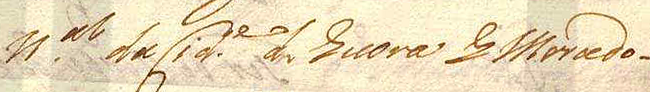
n.al da Cid.e d. Euora E Morado
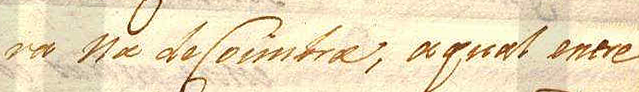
ra na de Coimbra, a qual entre
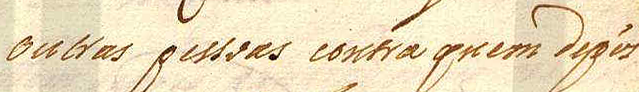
outras pessoas contra quem depo̅s
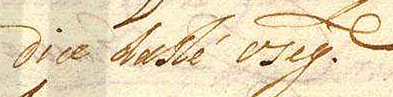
dice da Ré o seg.te
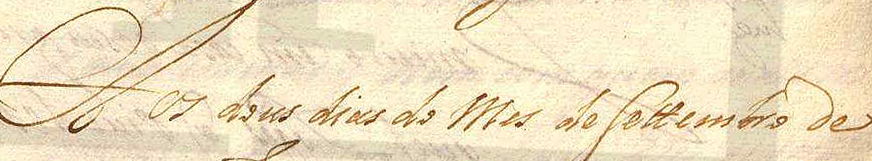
Aos dous dias do Mes de Settembro de
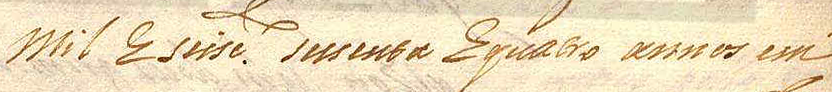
mil E seiscto. sessenta E quatro annos em
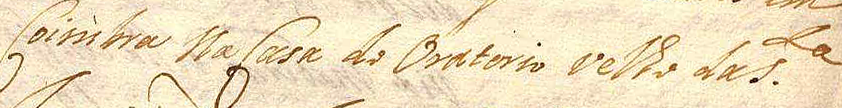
Coimbra na Casa do Oratorio velho da s.ta
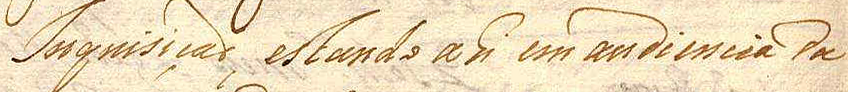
Inquisição, estando ahi em audiencia da
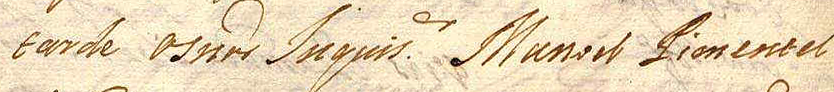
tarde o sno̅r Inquis.or Manoel Pimentel
